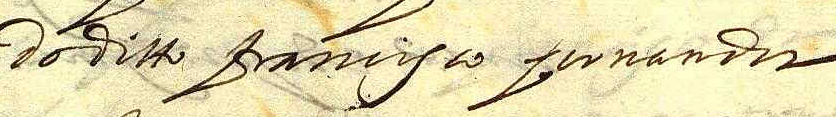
do ditto francisco fernandez
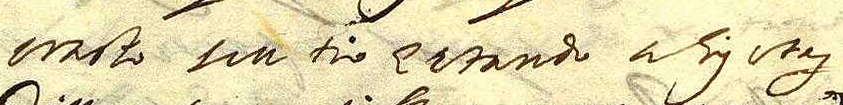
crasto seu tio E estando ahy elas
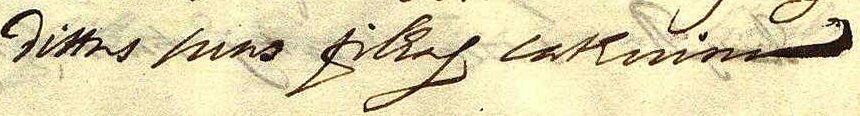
dittas suas filhas catherina
